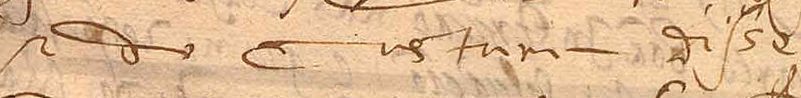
e do Custume disse
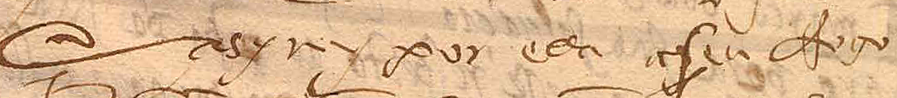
e asyney por ella a seu Rogo
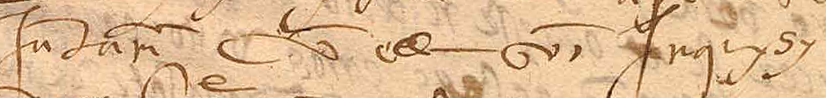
Jūtamte Cō elle sōr Jnquysy
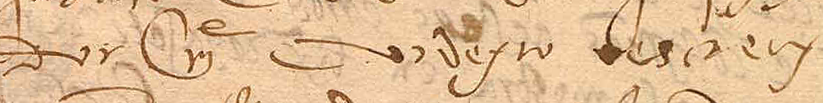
doe mel Cordeyro o escrevy
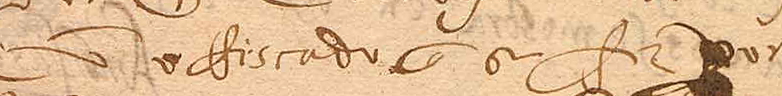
cō o Riscado q̄ se fez por
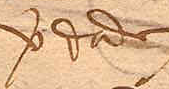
ꝟdade
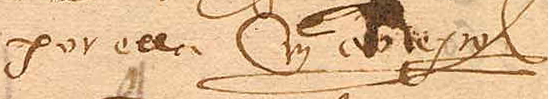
por ella mel cordeyro
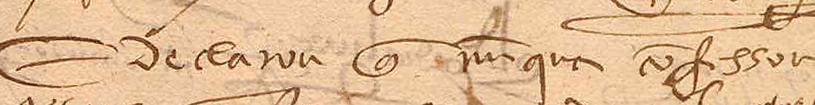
E declarou q̄ nūqua cōfessou
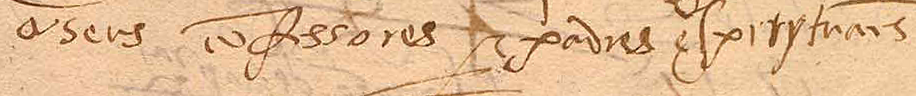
a seus cōfessores e padres espirytuaēs
